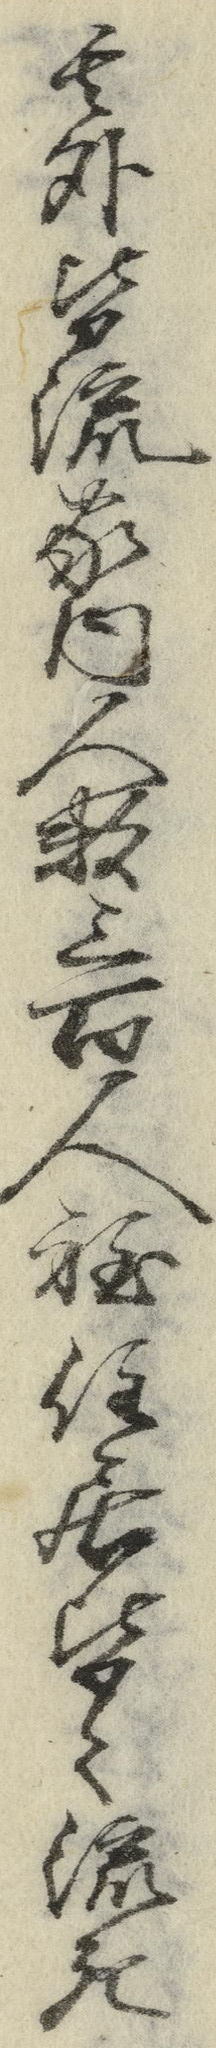其外皆流家内人数三百人程住居皆々流死
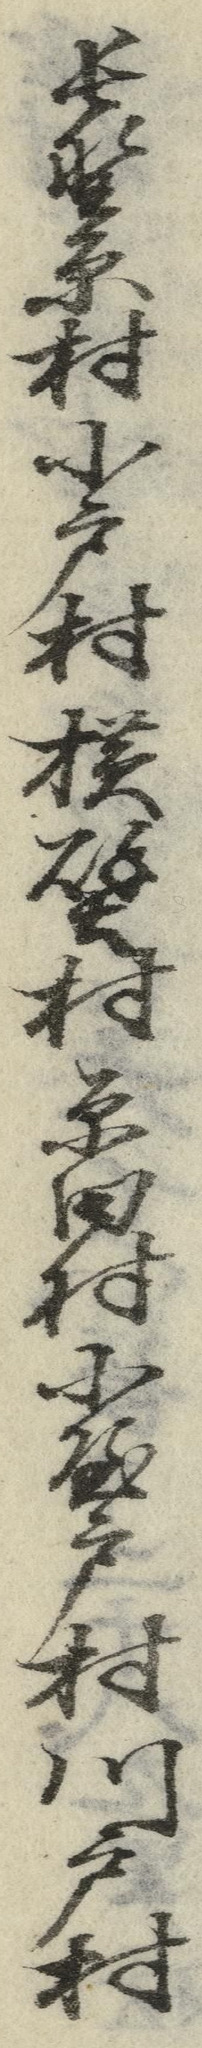長野原村小戸村横壁村原田村小屋戸村川戸村
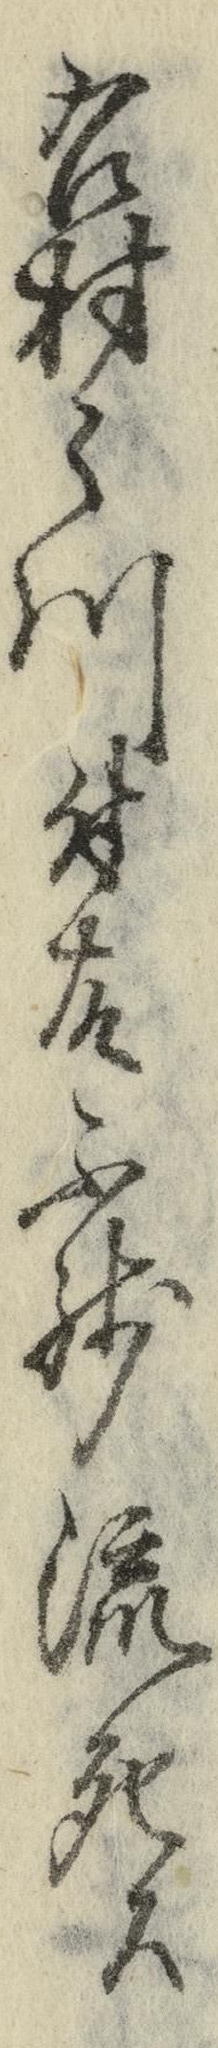右村々川付故不残流死ス
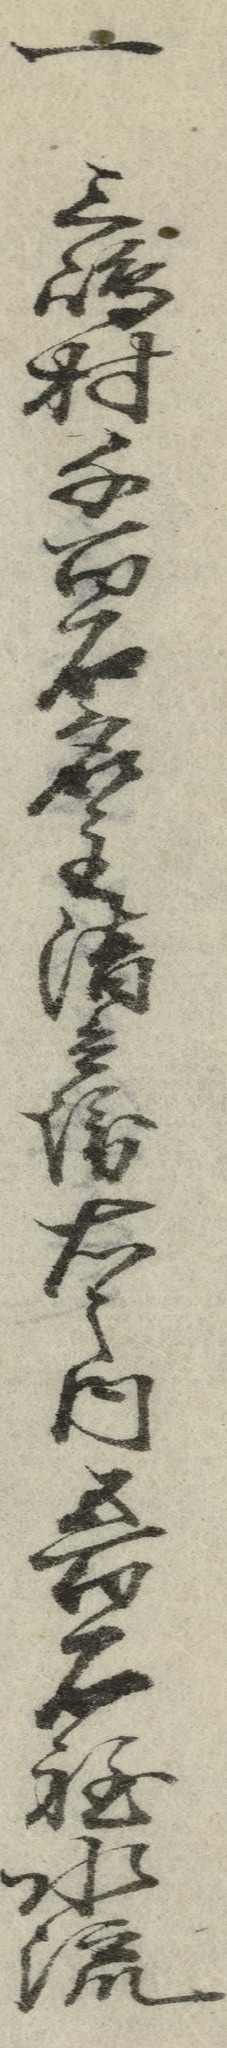一三嶋村千百石名主清兵衛右之内五百石程水流
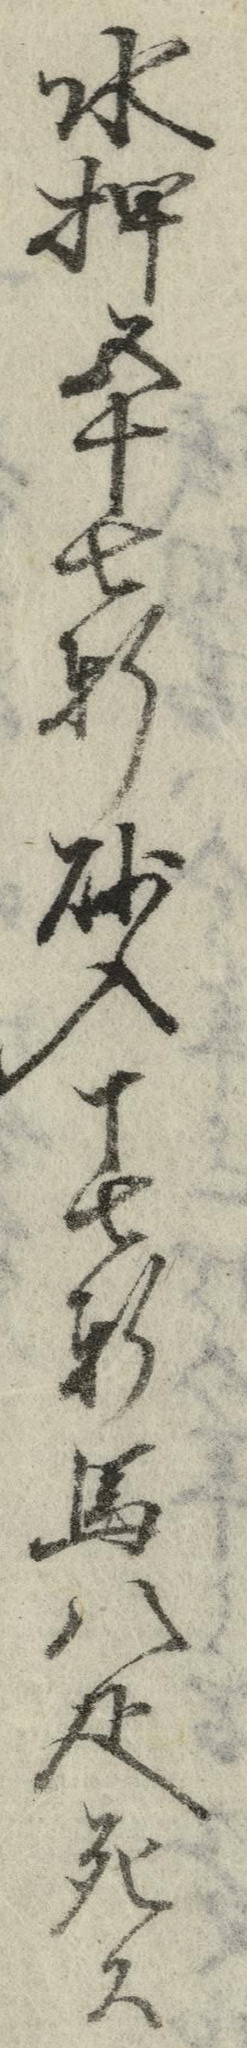水押五十七軒砂入十七軒馬八疋死ス
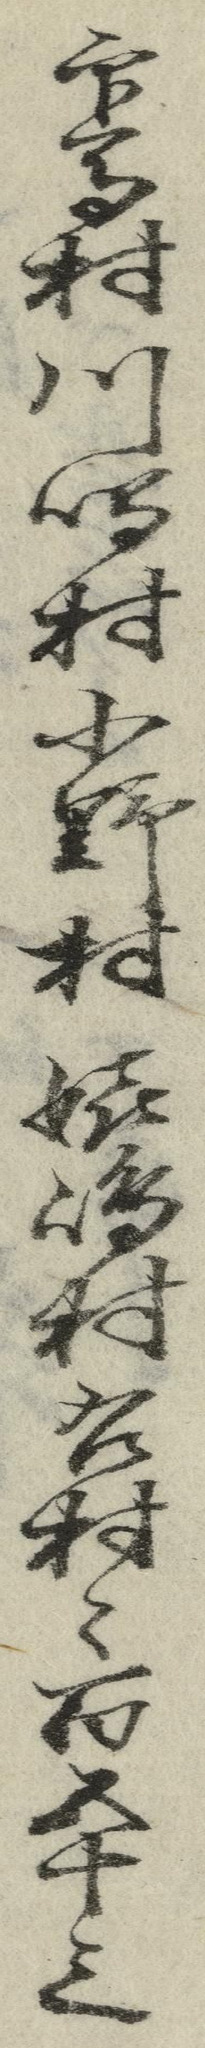印馬村川鳴村小野村嬉嶋村右村々百五十三
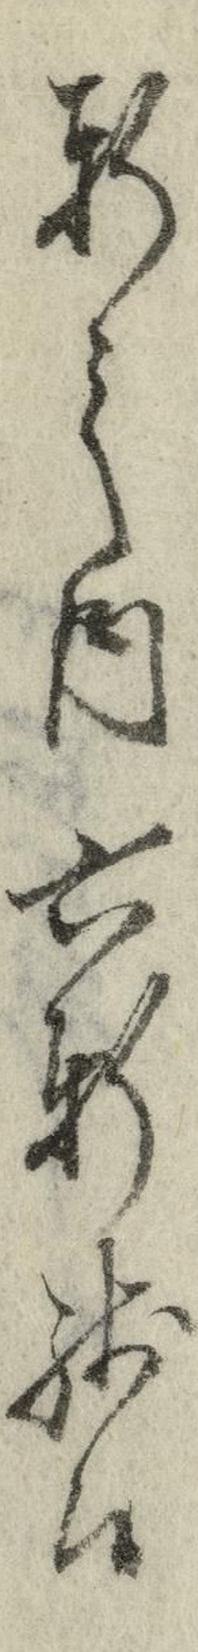軒之内六軒残候
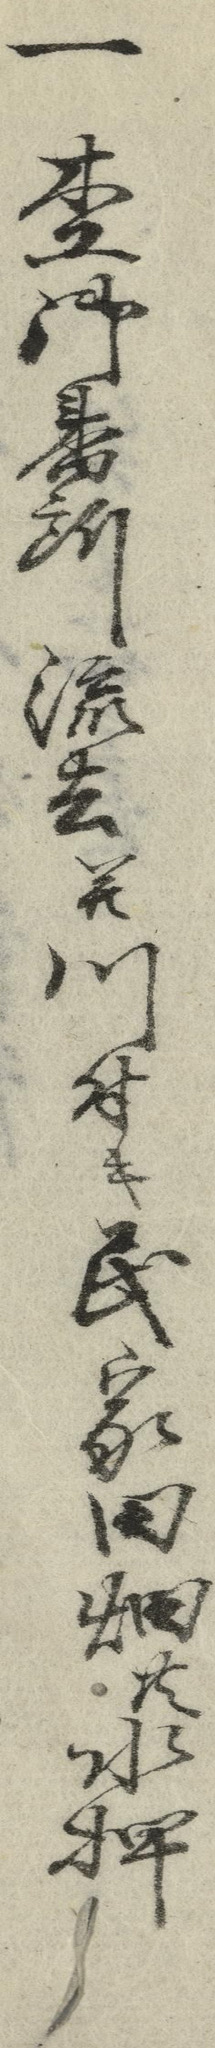一杢御番所流去幷川付キ民家田畑共水押
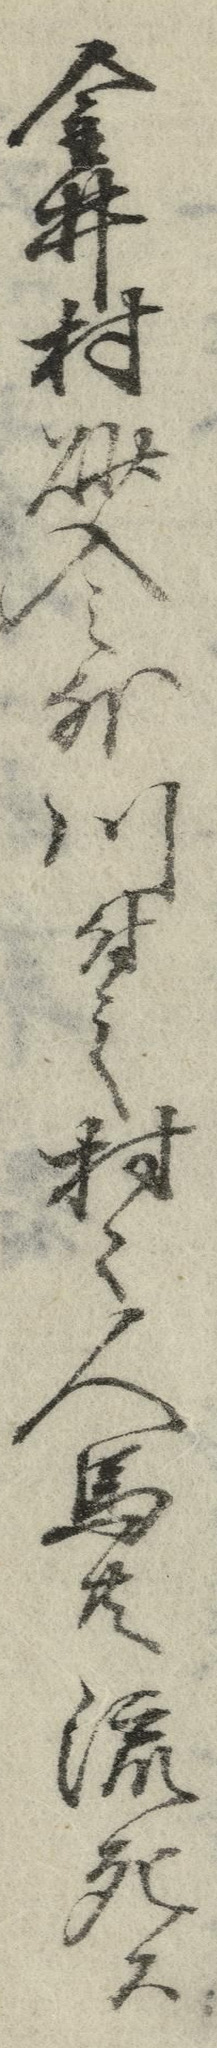金井村砂入之外川付之村々人馬共流死ス
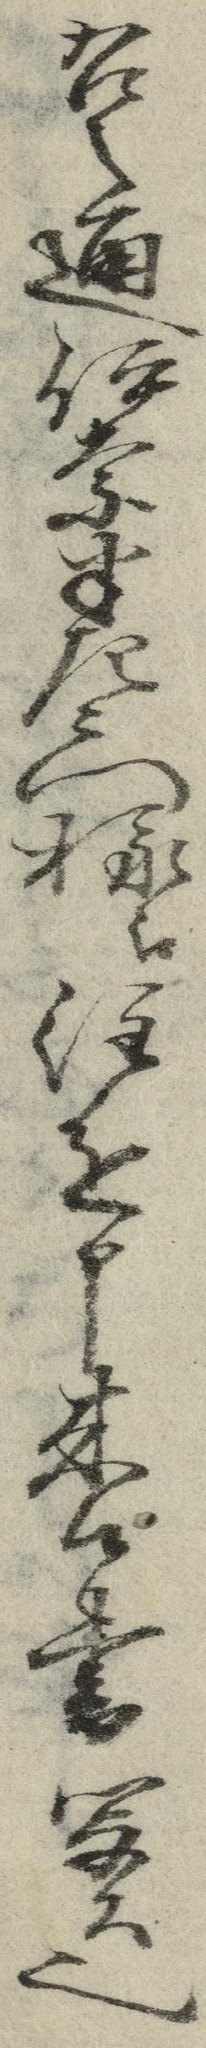右之通伊奈半左衛門様江注進申来候書写ス也

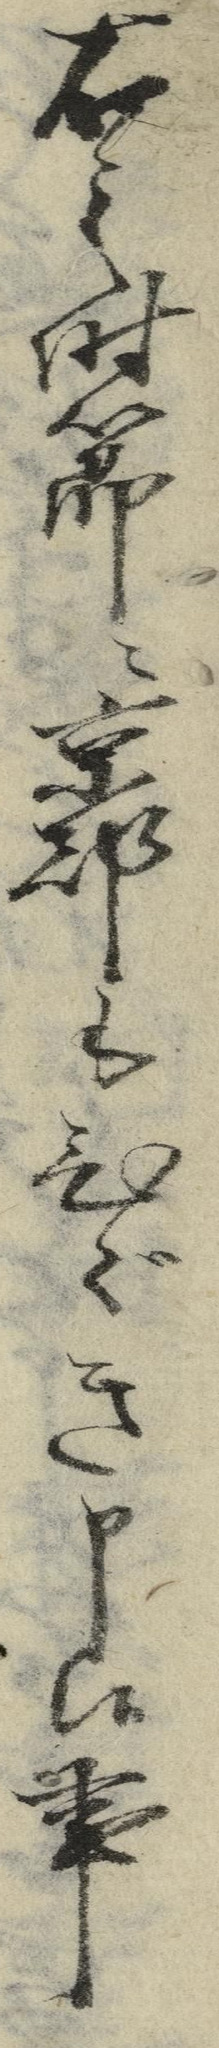右之時節ニ京都もひゞき申候事
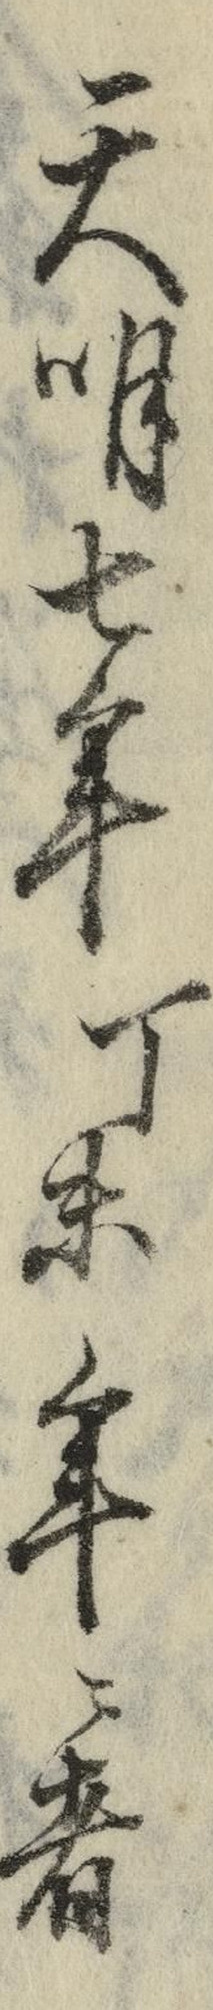天明七年丁未年には
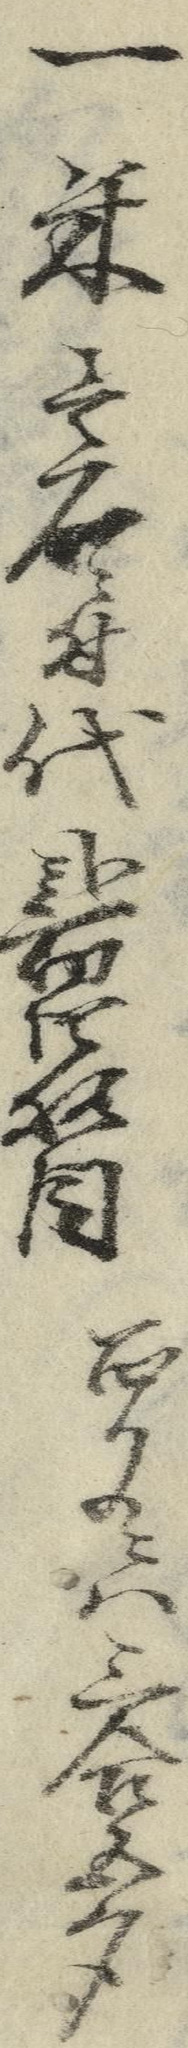一米壱石ニ付代弐百四拾目百文ニハ三合五勺
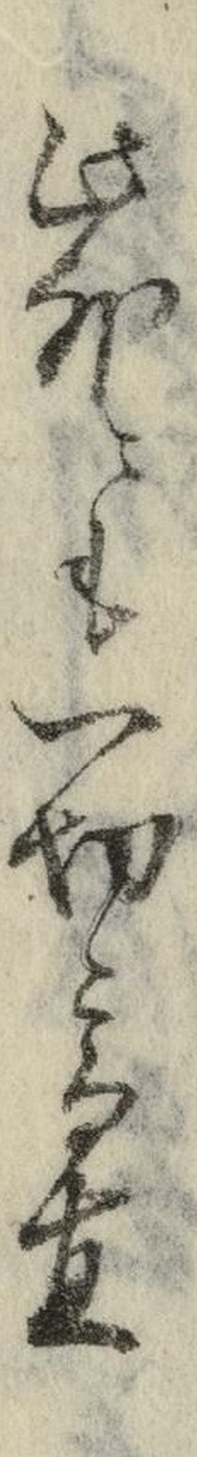此外ニも一切高直
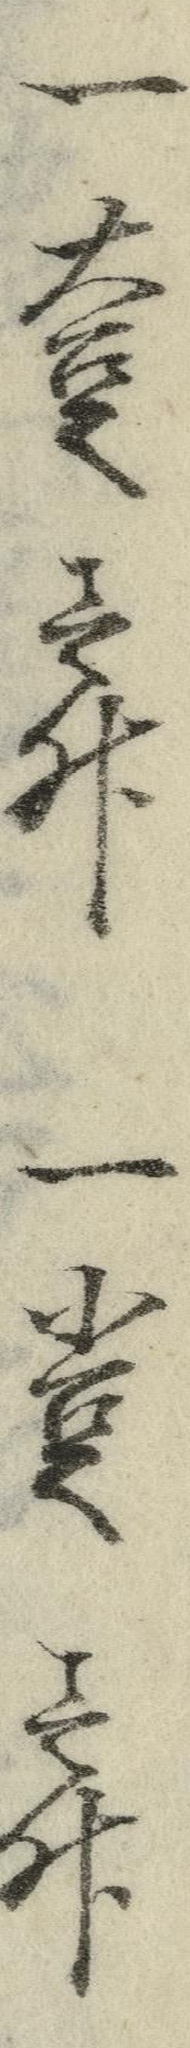一大豆壱升一小豆壱升
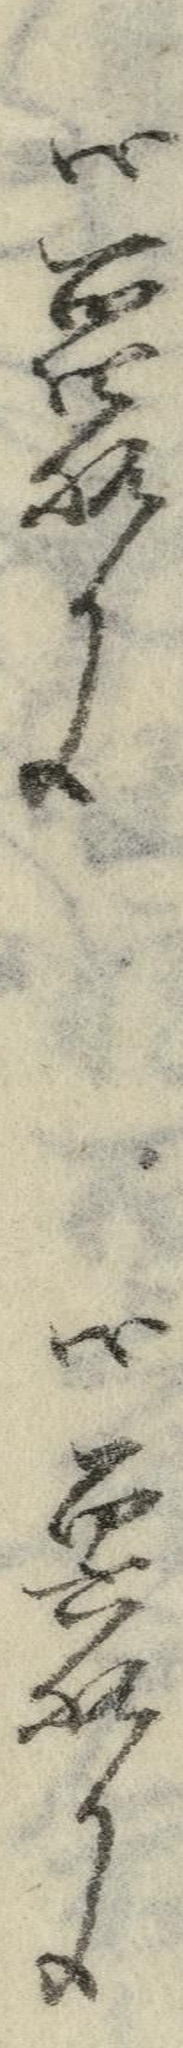同百四拾文同百六拾文
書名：信州浅間山焼
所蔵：東京大学地震研究所図書室 Earthquake Research Institute Library, The University of Tokyo, JAPAN
